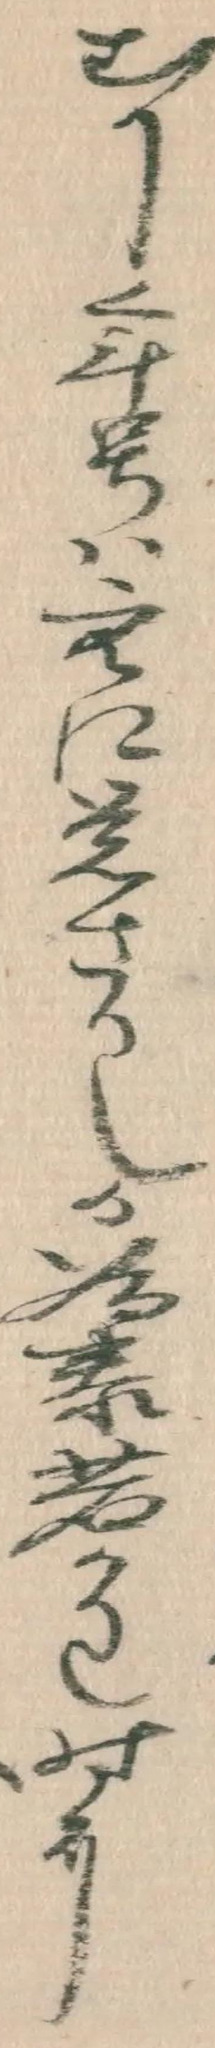むかし年号は空に覚さりしか為泰若かりし時に
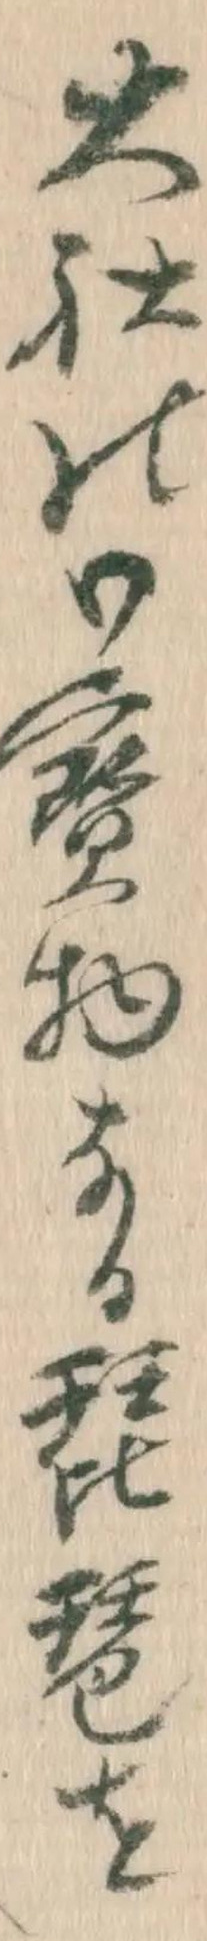大社の御宝物なる琵琶を
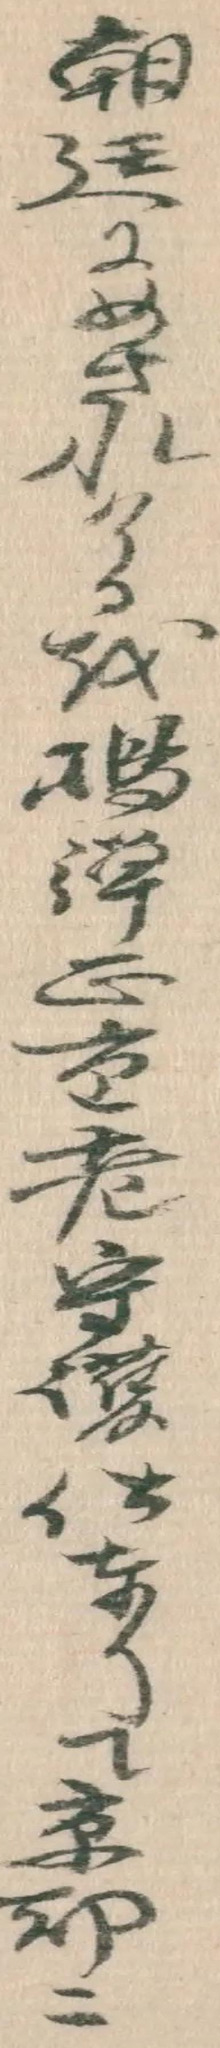朝廷にめされけるを嶋弾正重老守護仕奉りて京都に
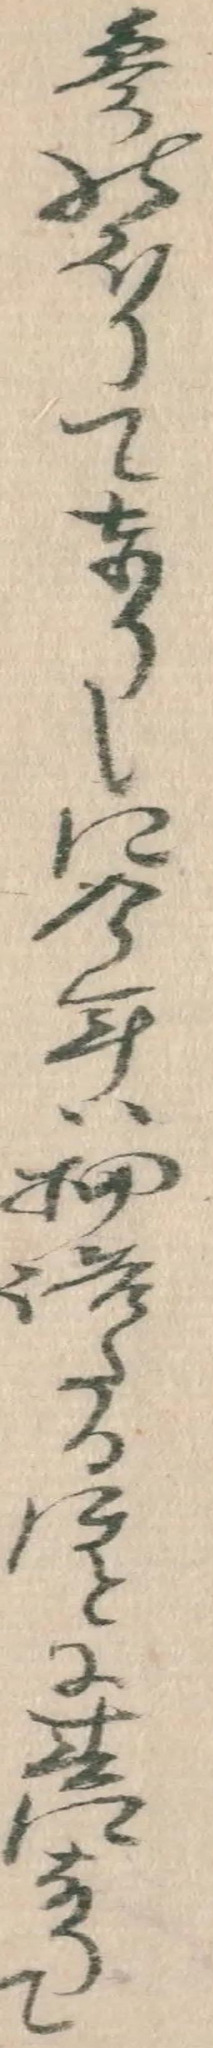参のほりて奉りしに今年は押詰たるほとに春になりて
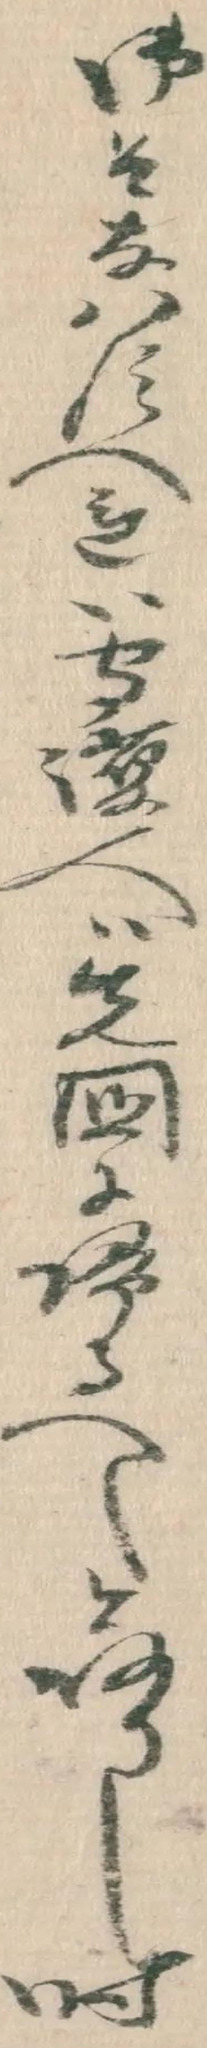御そなはすへれは守護人は先国に帰るへしとありし時
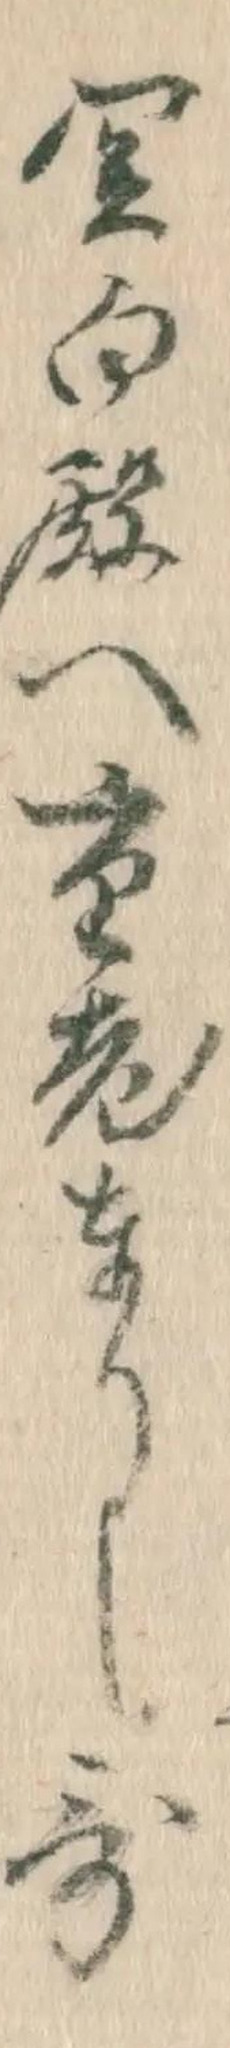関白殿へ重老奉りし哥
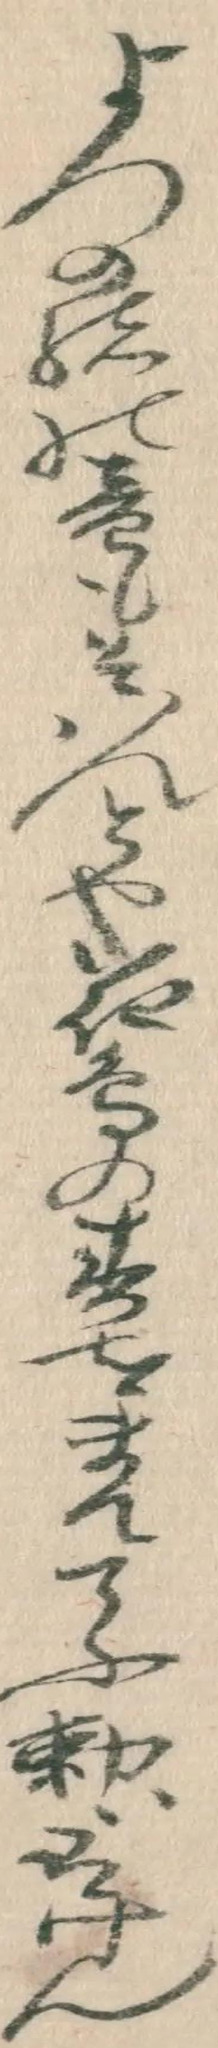よつの緒の音もそはんとや花鳥の春をまててふ勅は有けん
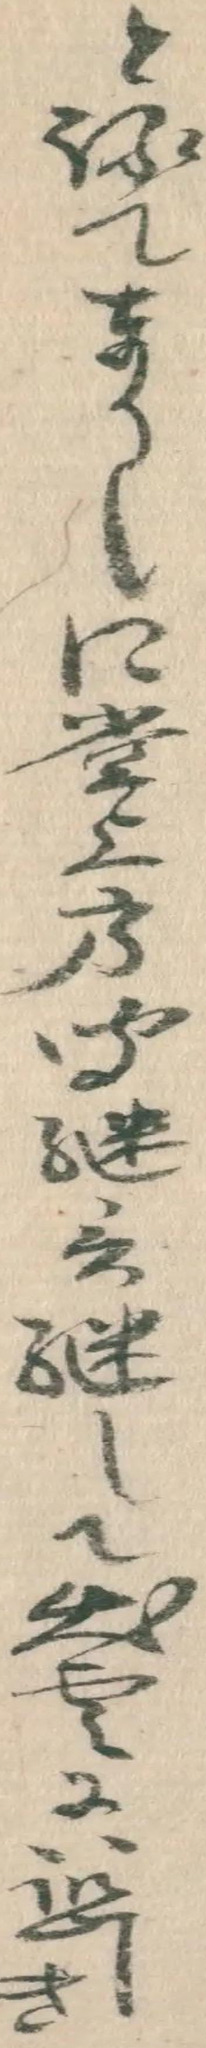と詠て奉りしに堂上方聞継言継して出雲には恐しき
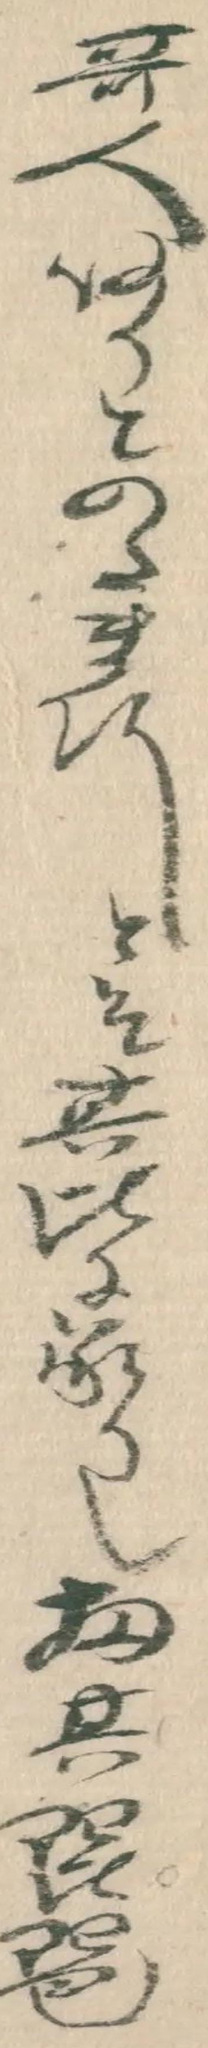哥人ありとのたまひしとそ其比に承り候扨其琵琶

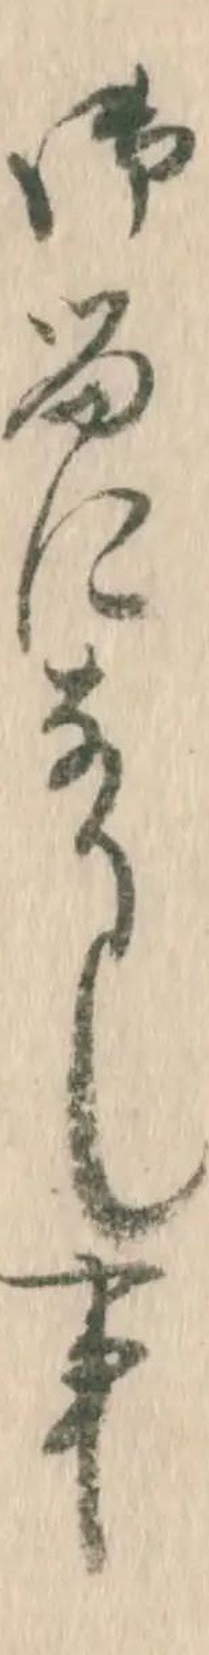御留になりし事
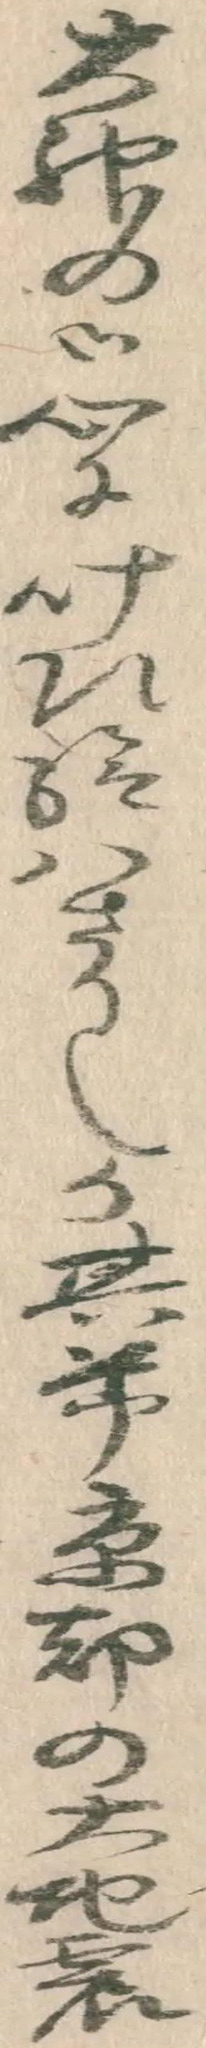大神の御心に叶ひ給はさりしか其節京都の大地震
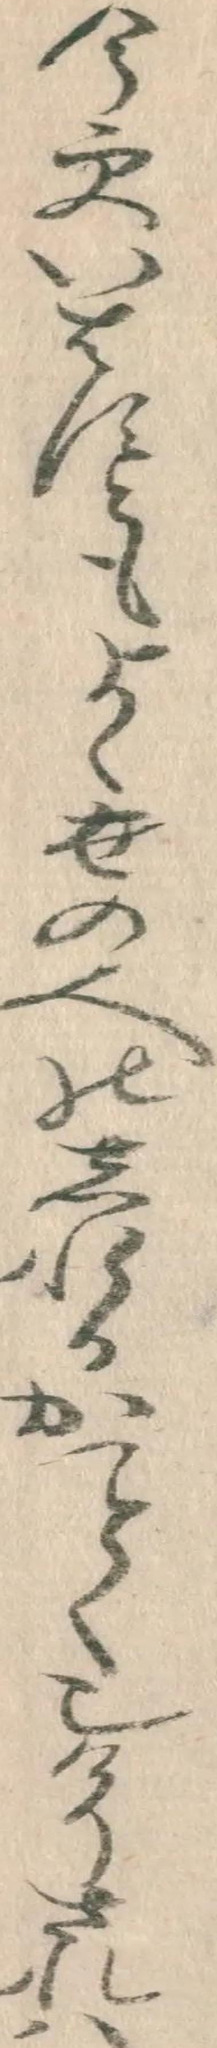今更いはすともよく世の人のしれるかことく也けりされは
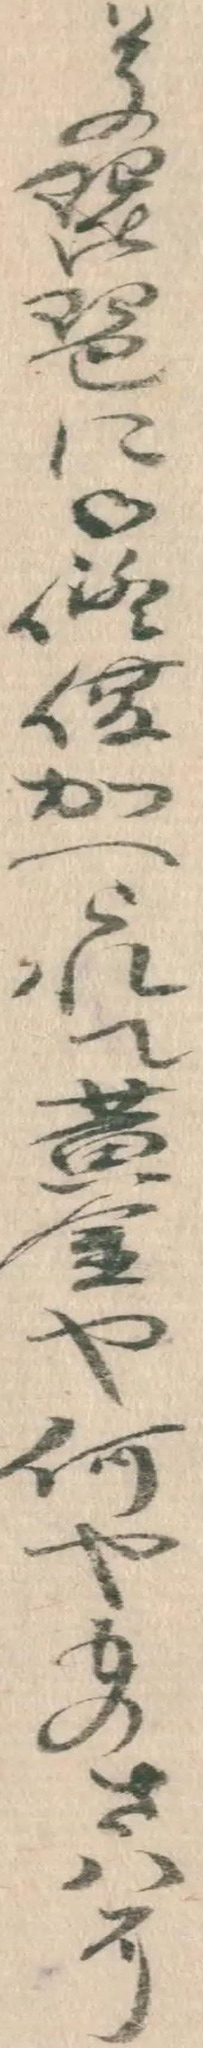その琵琶に御修復加へられて黄金や何やものさはに
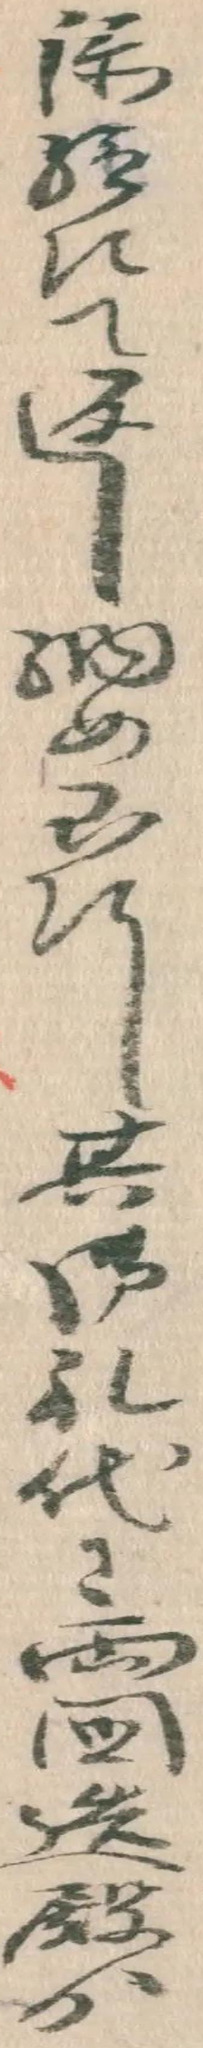添給ひて返し納め玉ひし其御礼代に両国造殿ゟ
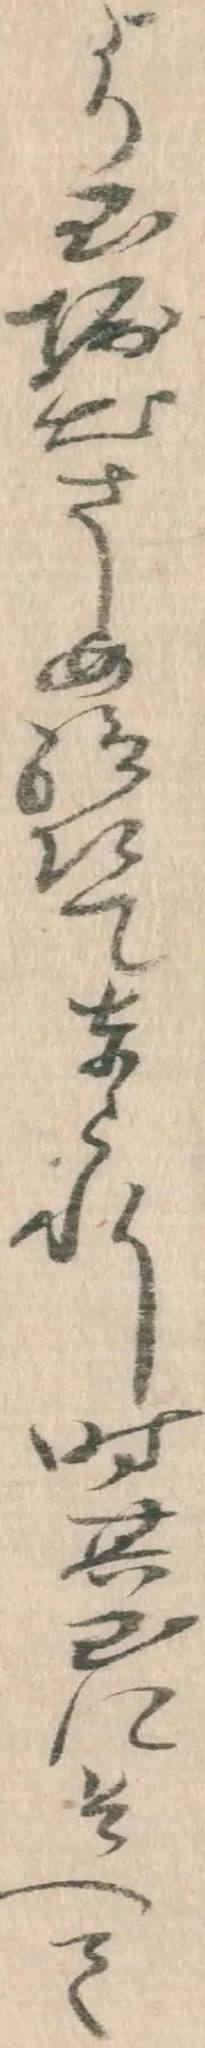より玉堀出さしめ給ひて奉られし時其玉にそへて
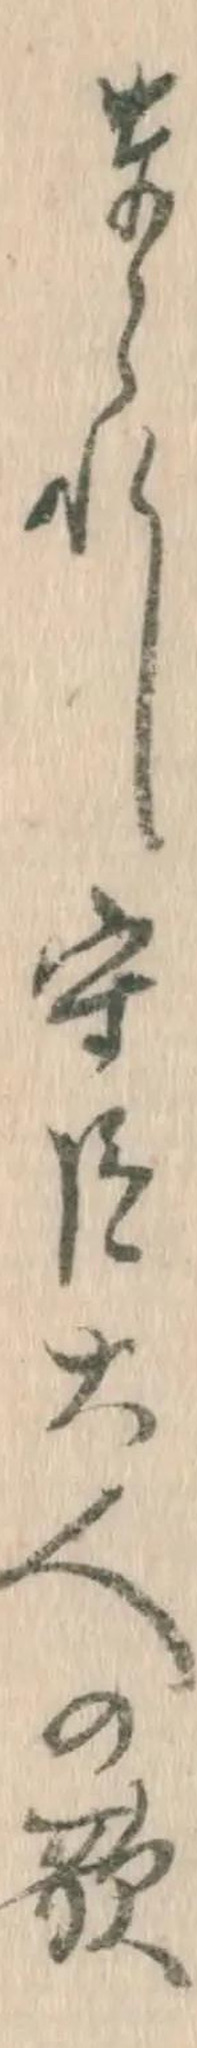奉られし守臣大人の歌
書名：出雲紀行. 20
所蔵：国立国会図書館 National Diet Library, JAPAN
